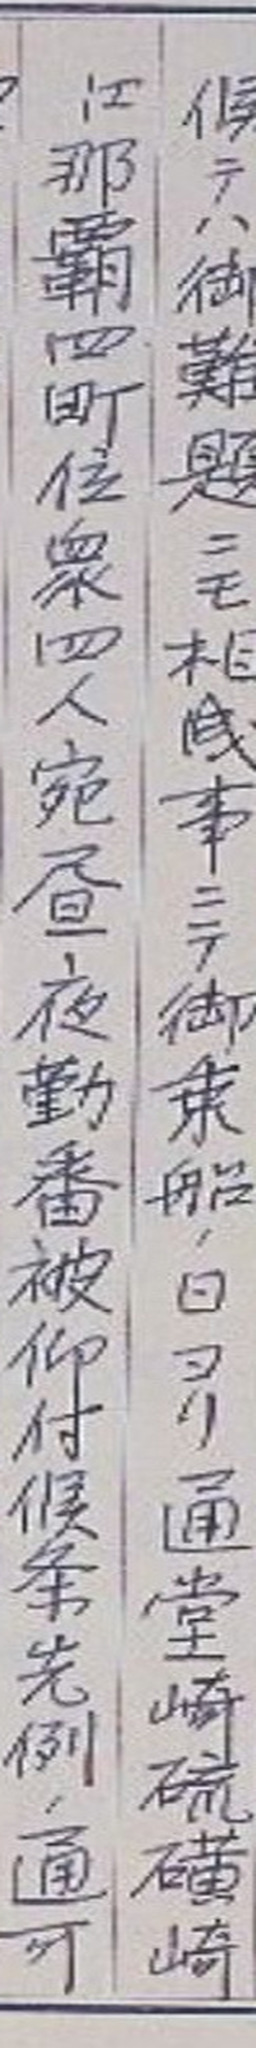え那覇四町位衆四人宛昼夜勤番被仰付候条先例の通可
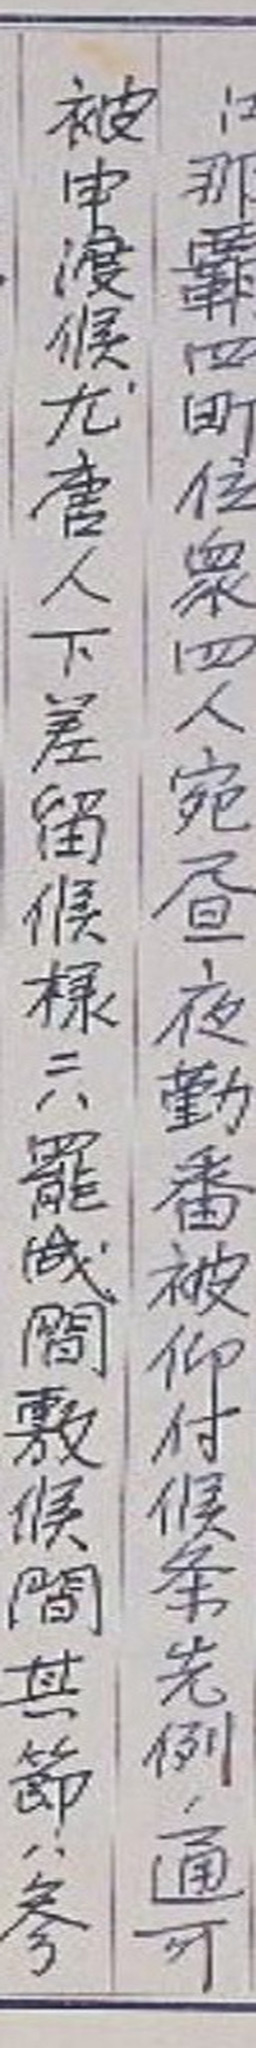被申渡候尤唐人下差留候様には罷成間敷候間其節は参
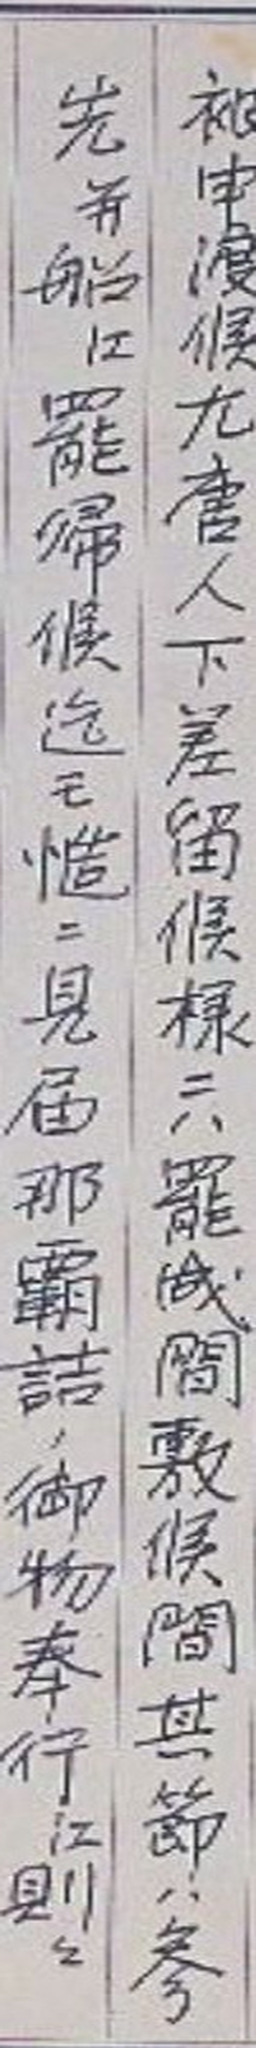先并船え罷帰候迄も慥に見届那覇詰の御物奉行え則々
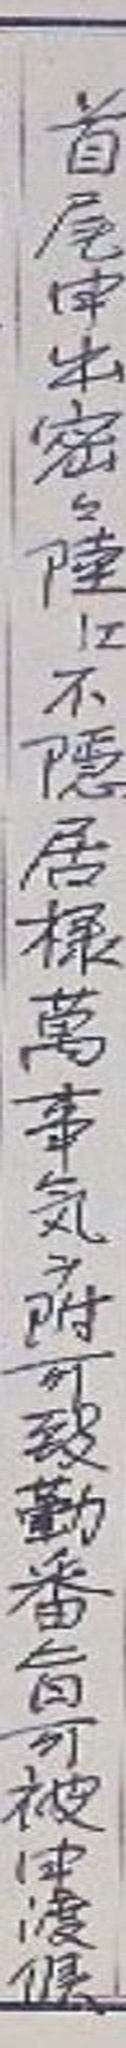首尾申出密々陸え不隠居様万事気を附可致勤番旨可被申渡候
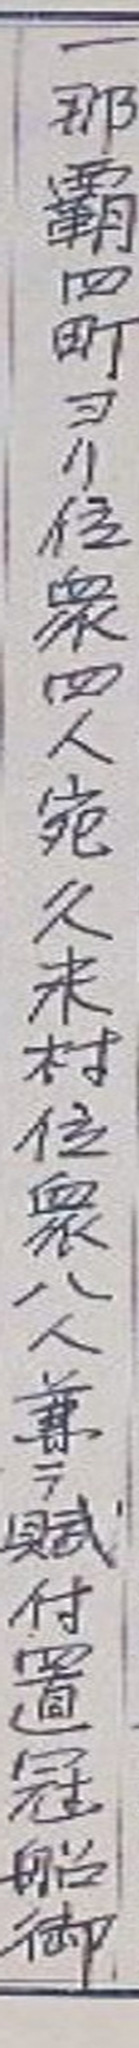一那覇四町より位衆四人宛久米村位衆八人兼て賦付置冠船御
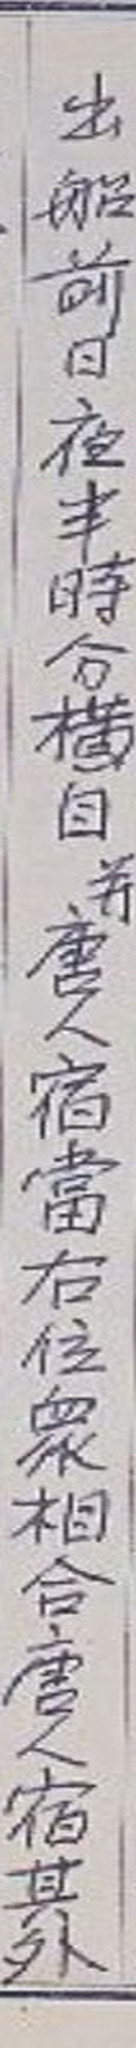出船前日夜半時分横目并唐人宿当右位衆相合唐人宿其外
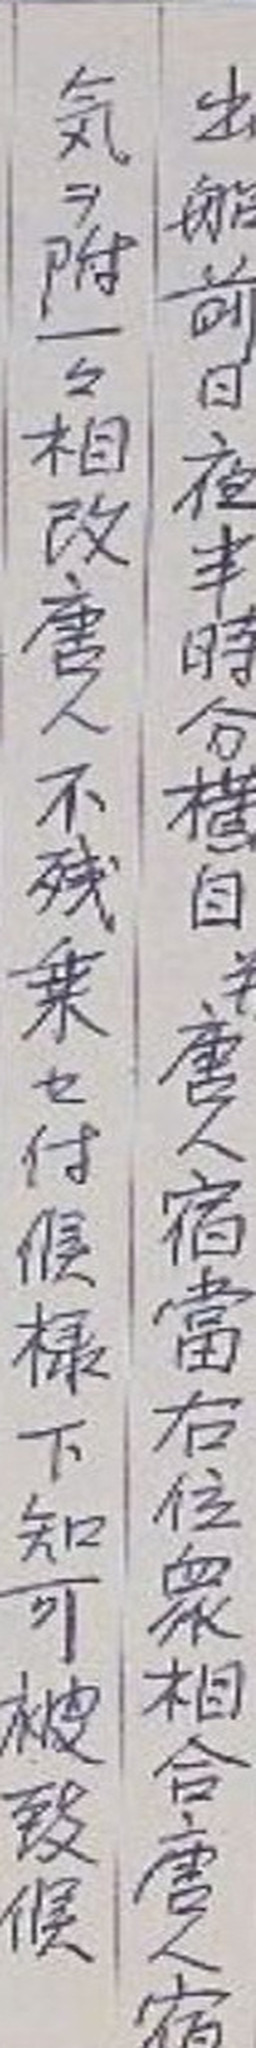気を附一々相改唐人不残乗せ付候様下知可被致候
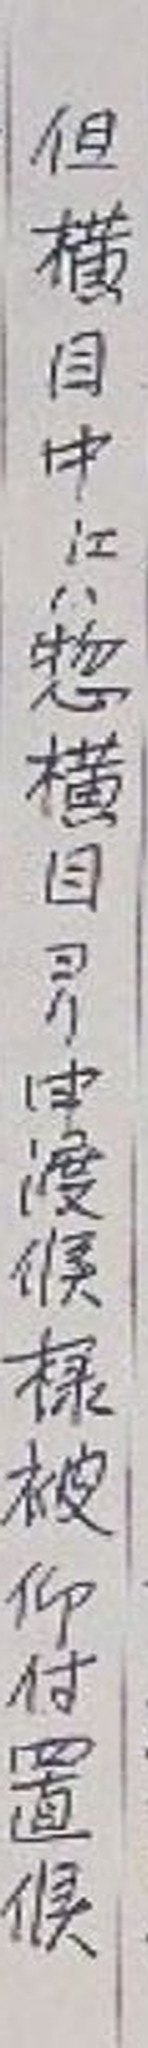但横目中えは惣横目より申渡候様被仰付置候
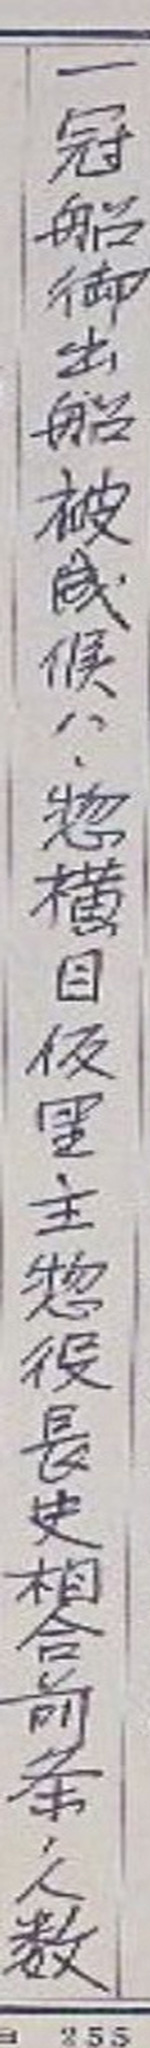一冠船御出船被成候はゝ惣横目仮里主惣役長史相合前条の人数
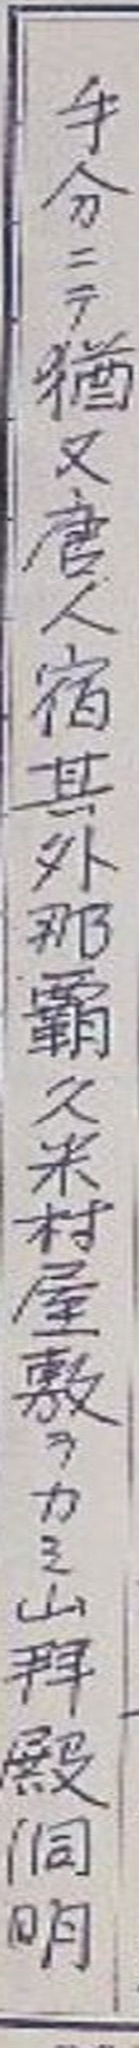手分にて猶又唐人宿其外那覇久米村屋敷をかみ山拝殿洞明
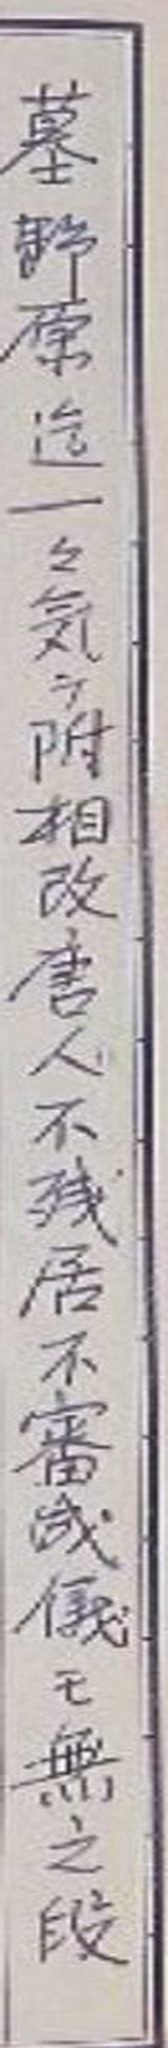墓野原迄一々気を附相改唐人不残居不審成儀も無之段
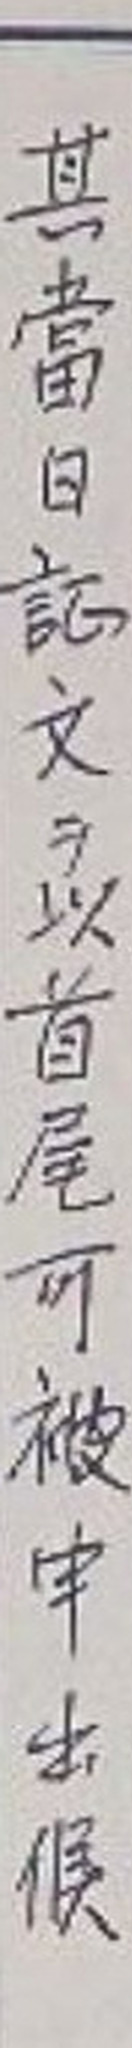其当日証文を以首尾可被申出候
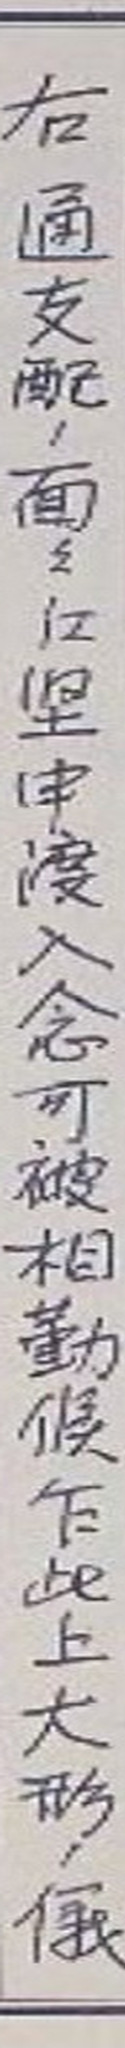右通支配の面々え堅申渡入念可被相勤候乍此上大形の儀
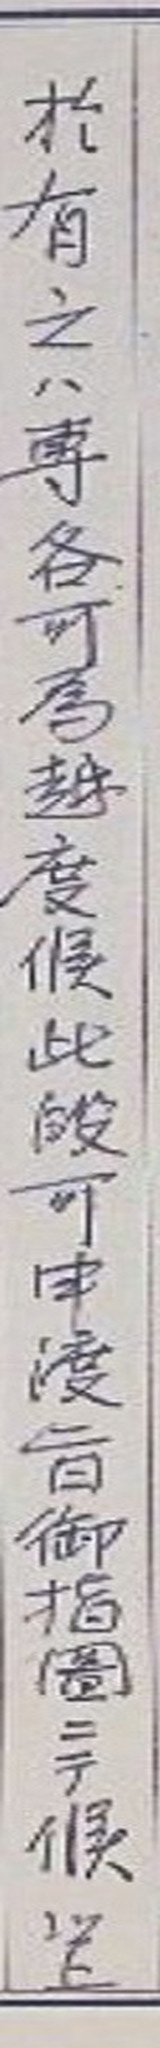於有之は専各可為越度候此段可申渡旨御指図にて候以上
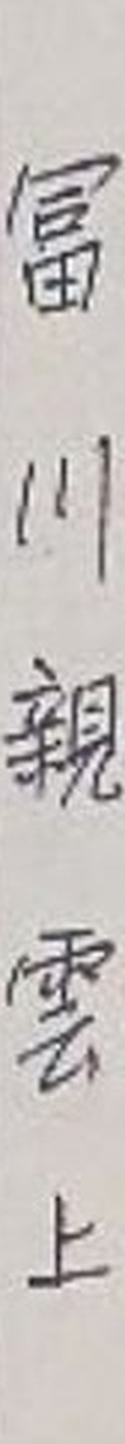冨島親雲上
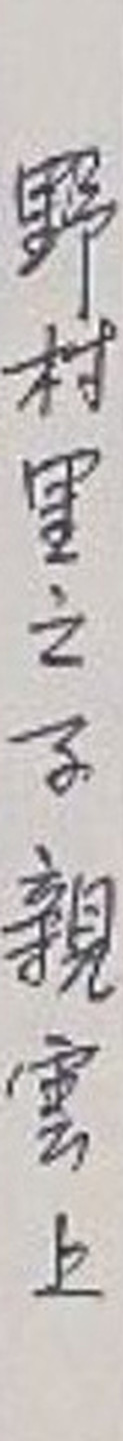野村里之子親雲上
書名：支那冊封使来琉諸記 下巻
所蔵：University of the Ryukyus Library
